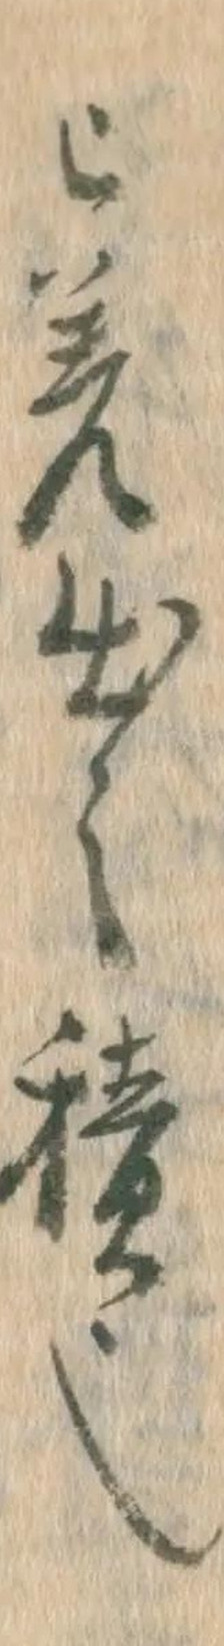被差出之積也、
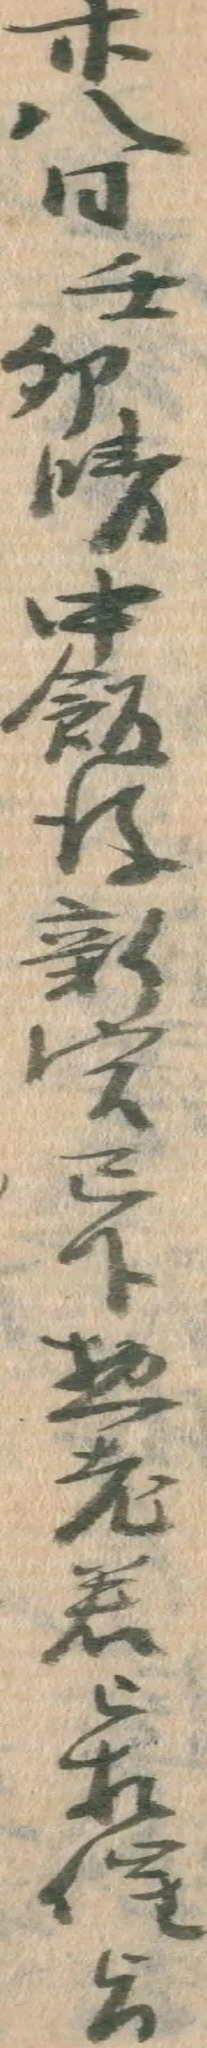廿八日壬卯晴、中飯後新宮已下惣老若被相催旨、
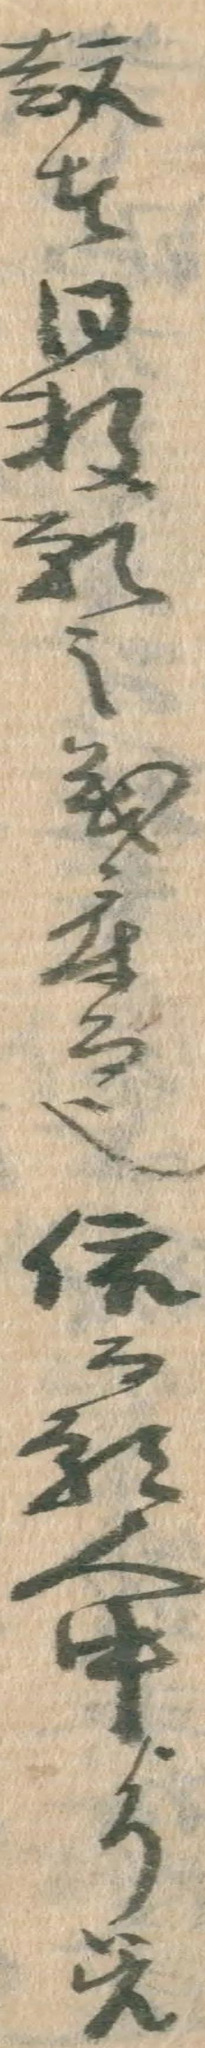趣者日数願之義ニ付而也、依而願人中より先
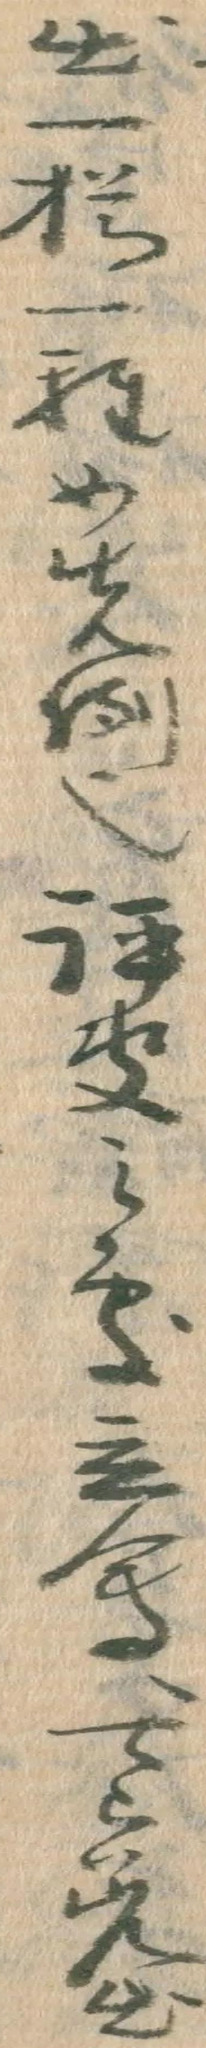出一樽一種如先例也、評決之處、立會へ可被差出
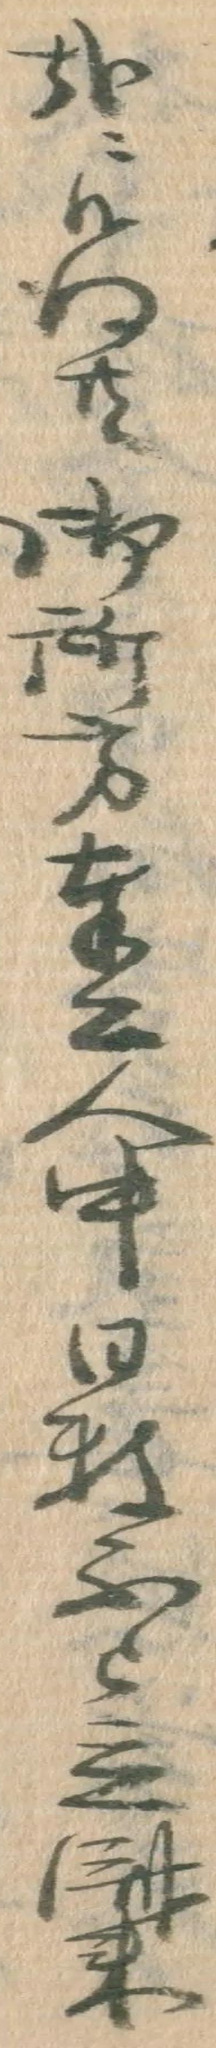哉ニ候得共、御所方奉公人中日数不被立済来
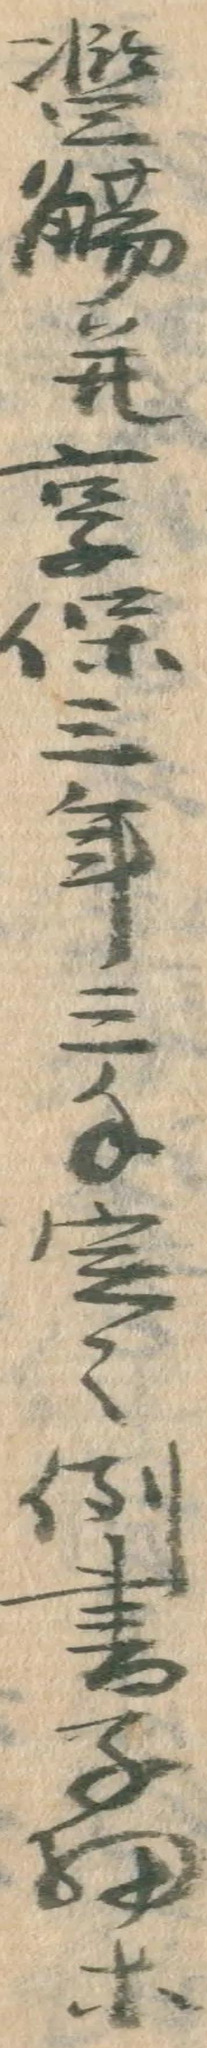濫觴并享保三年三手定之例書子細等
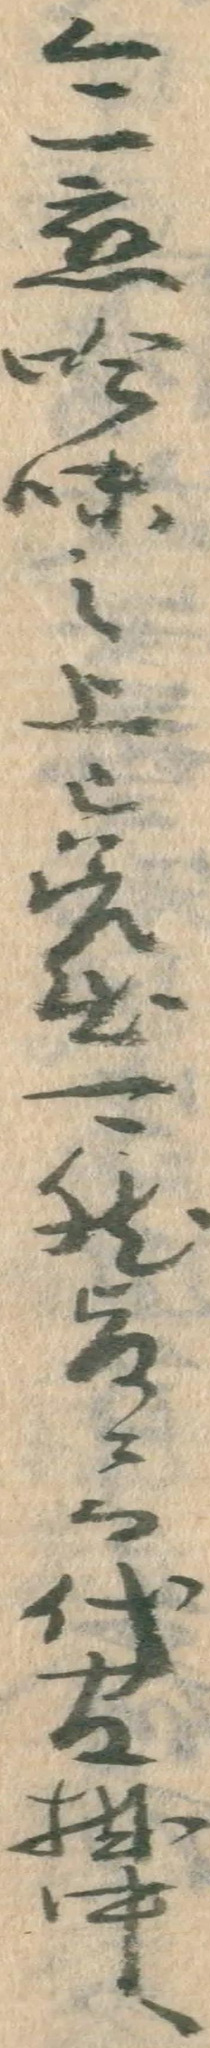無之、應吟味之上被差出可然旨ニ而代官掛中へ
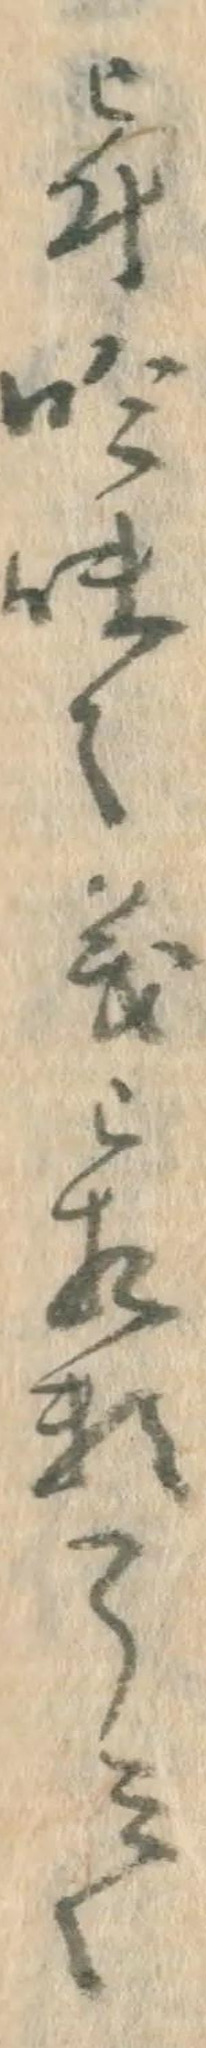被付、吟味之義被相頼了云々、

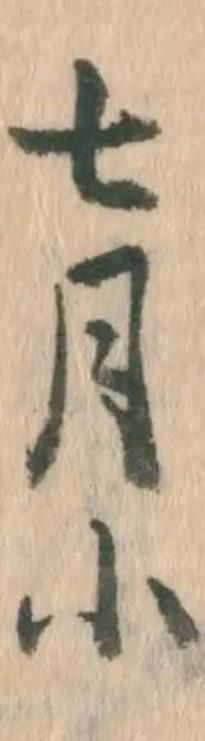七月小
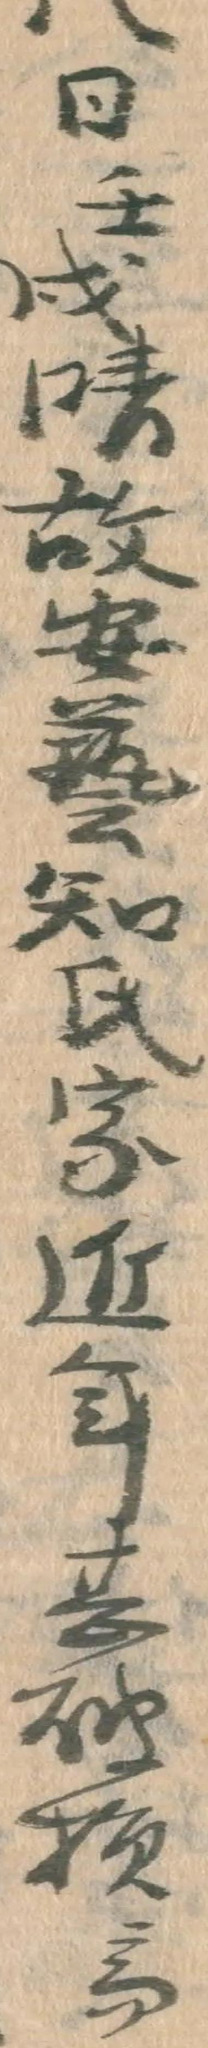八日壬戌晴、故安藝知氏家、近年甚破損ニ而
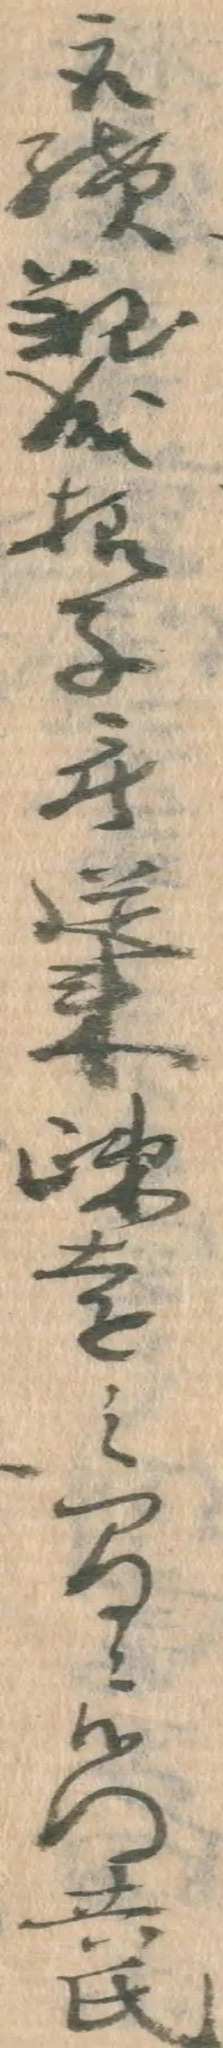取続難成様子ニ付、従来疎遠之間ニ候得共、氏
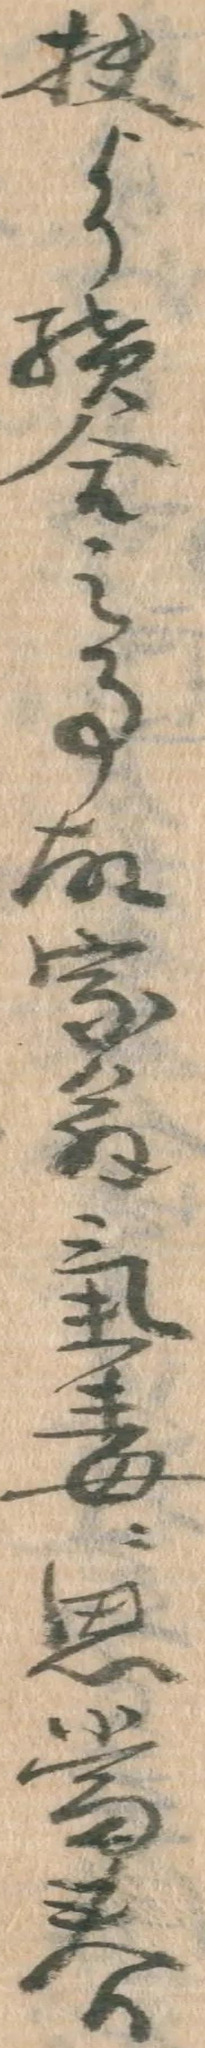扶より談合之事故、家翁気毒ニ思、當夫ゟ
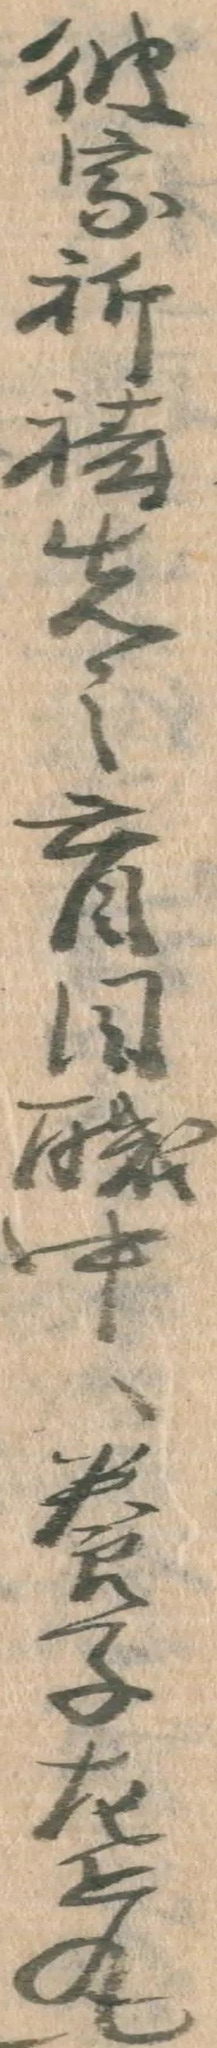彼家祈祷、先之盲目職中へ養子左近丸
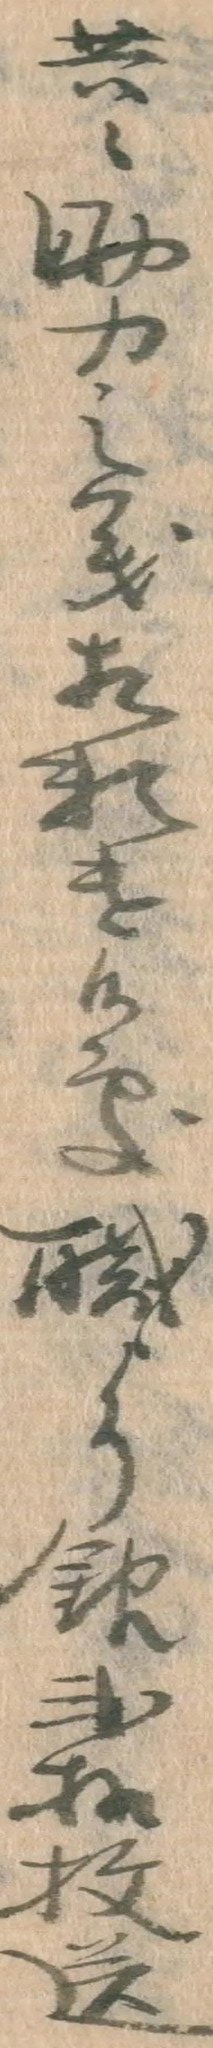共ニ助力之義相頼遣候處、職より銀弐拾枚送
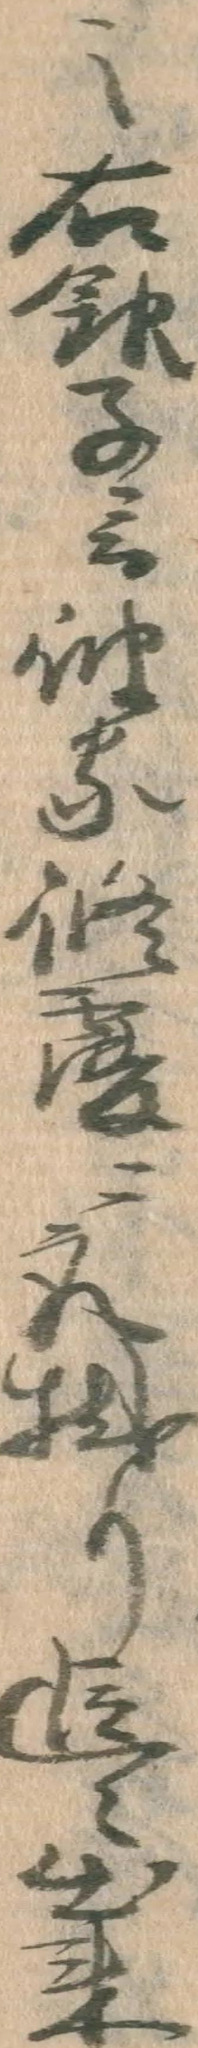之右銀子ニ而、彼家修覆ニ取掛り、追〻出来
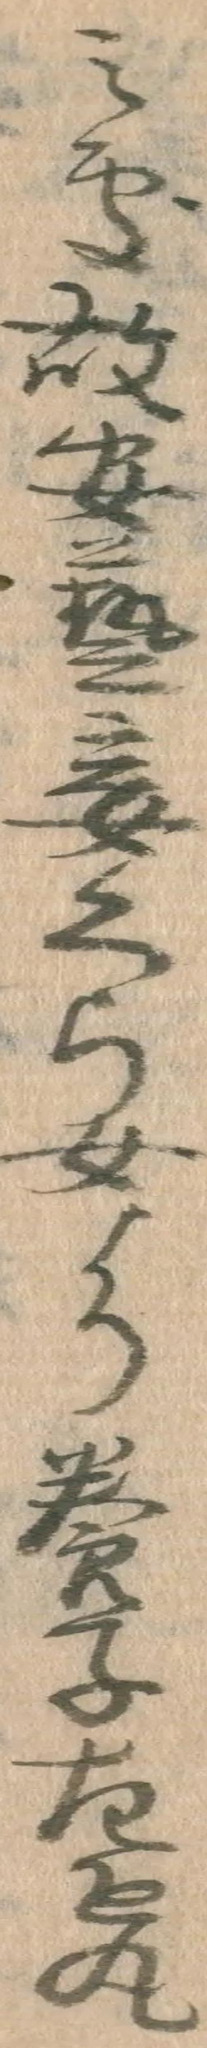之處、故安藝妾くら女より養子左近丸
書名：賀茂社記録. 第63冊
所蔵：国立国会図書館 National Diet Library, JAPAN
